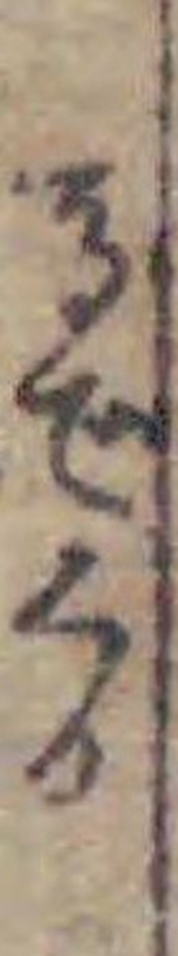馬でくる
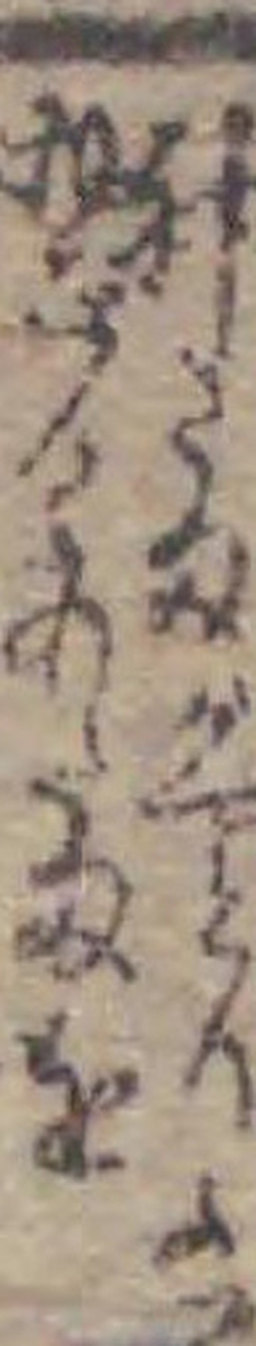おごるあたまを
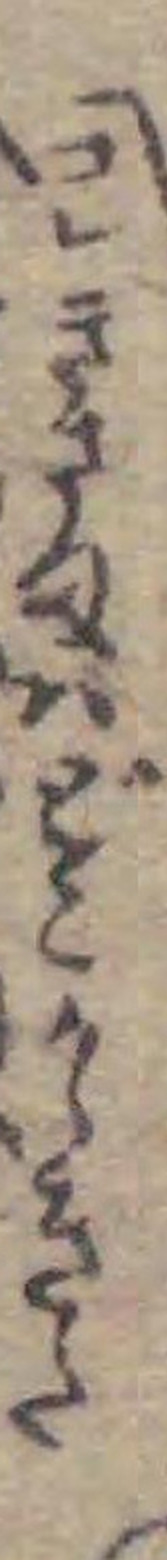〽コレきさまはどこからきた
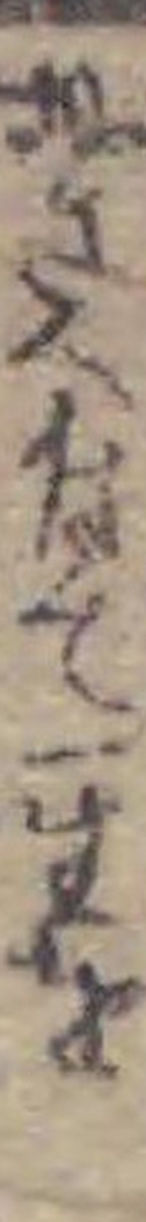おさへ付て一生を
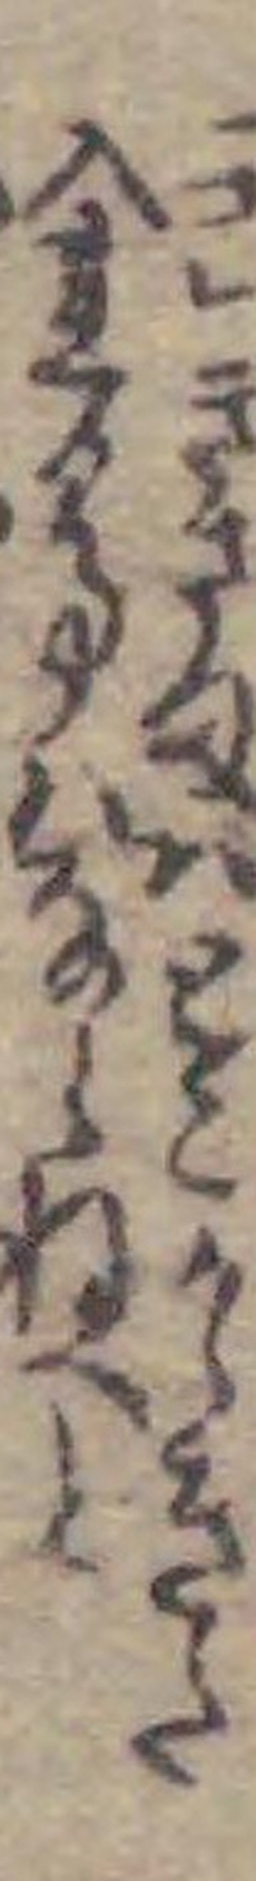入れる事はならねへと
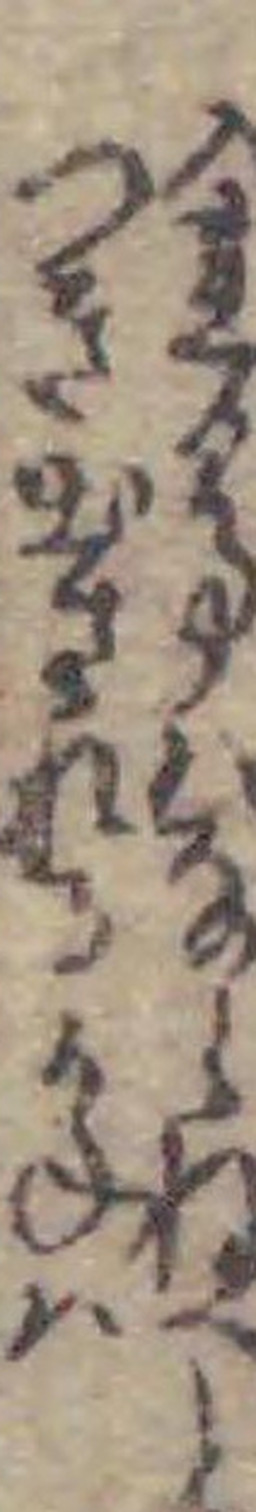つき出されるかねは
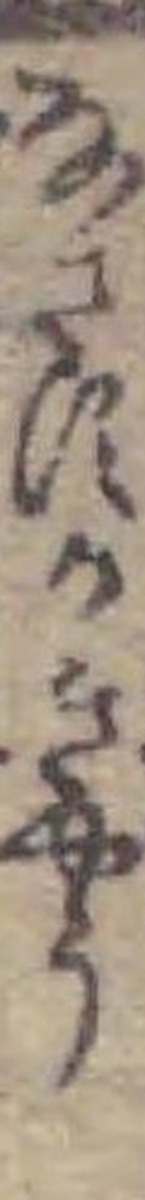なさすかきやう
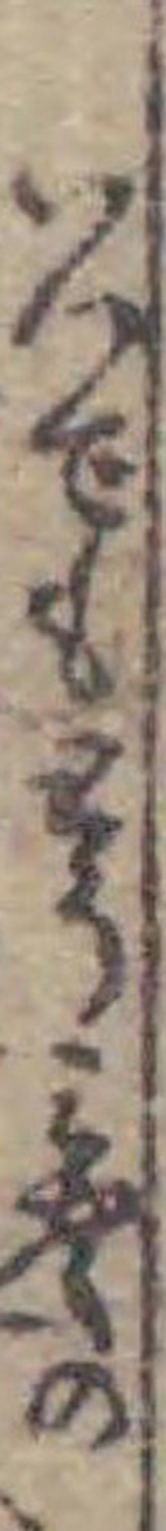いつでもとうみやくの
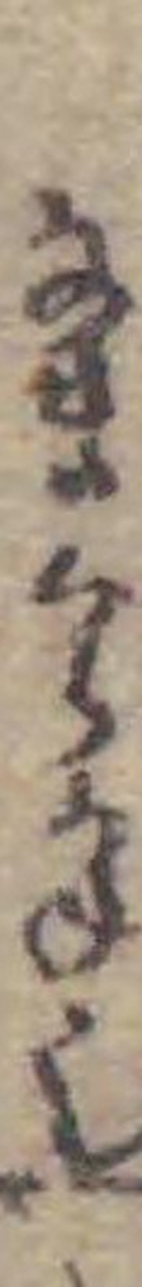なまくらかね也
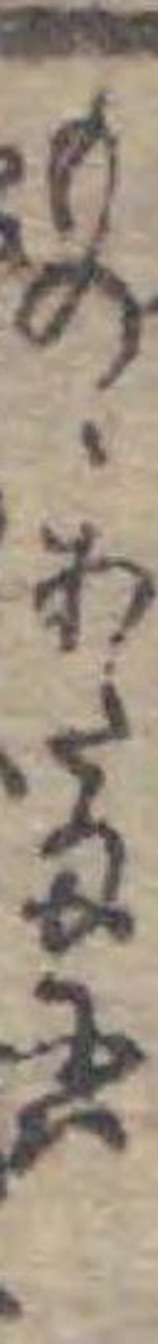ものゝあたまには
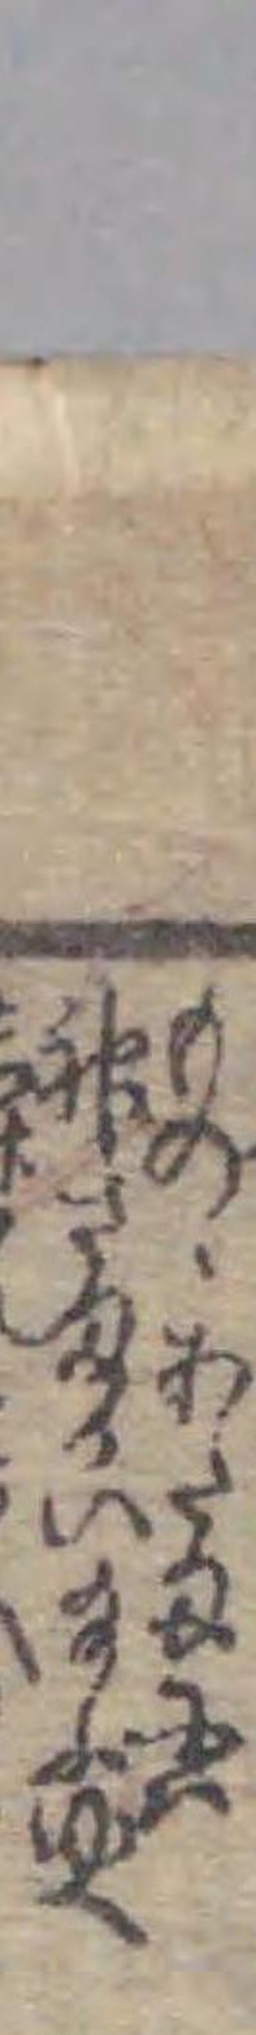神さまかい給ふゆへ
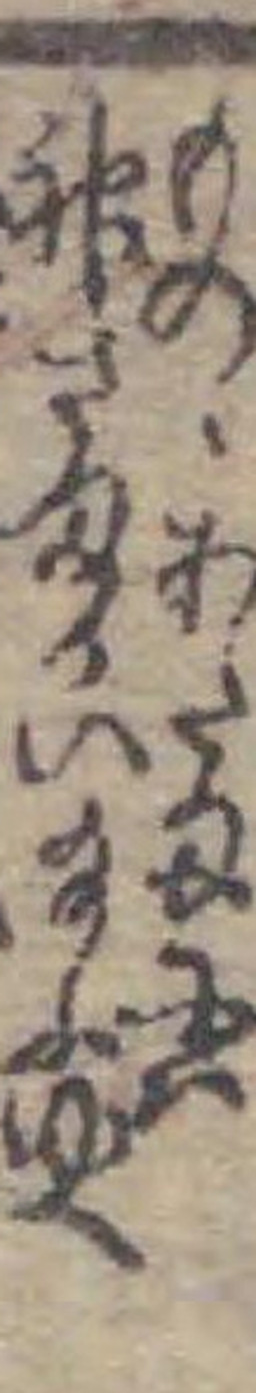神さまかい給ふゆへ
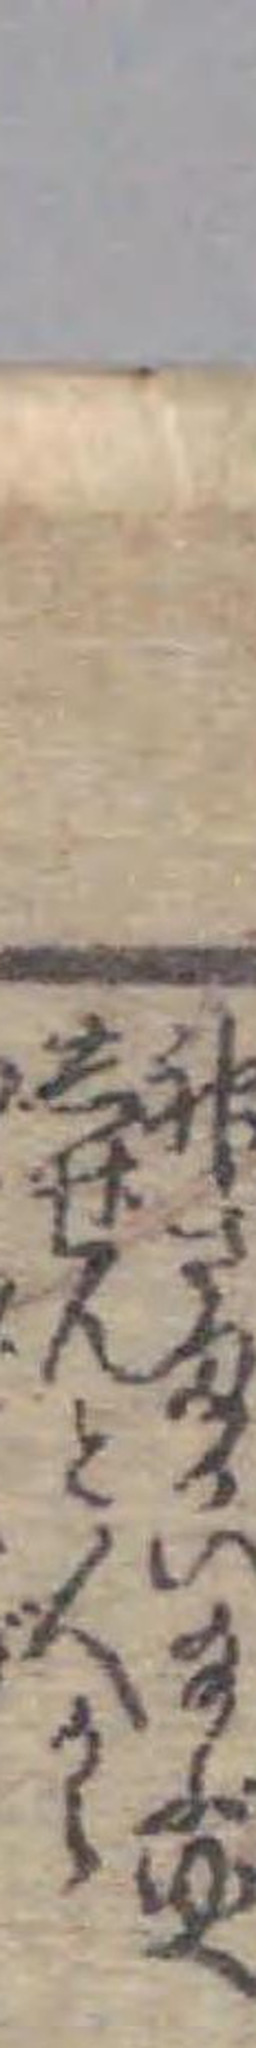しぜんと人から
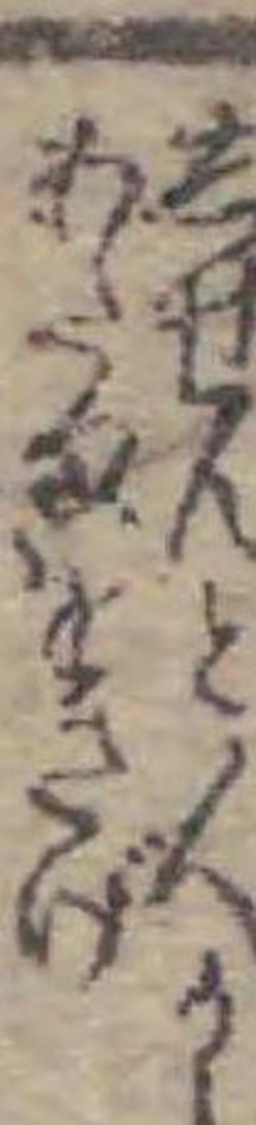あたまをさげ
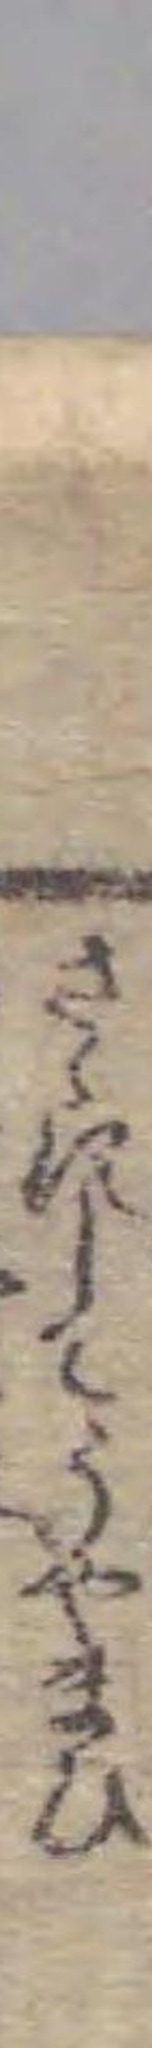さゝすしてうやまひ
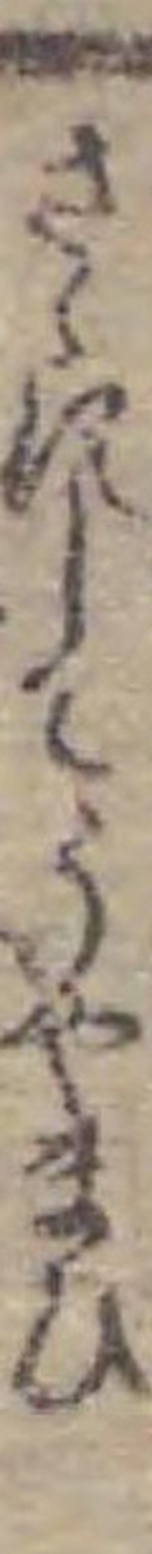さゝすしてうやまひ
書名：新鋳小判 : 3巻
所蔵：国立国会図書館 National Diet Library, JAPAN
